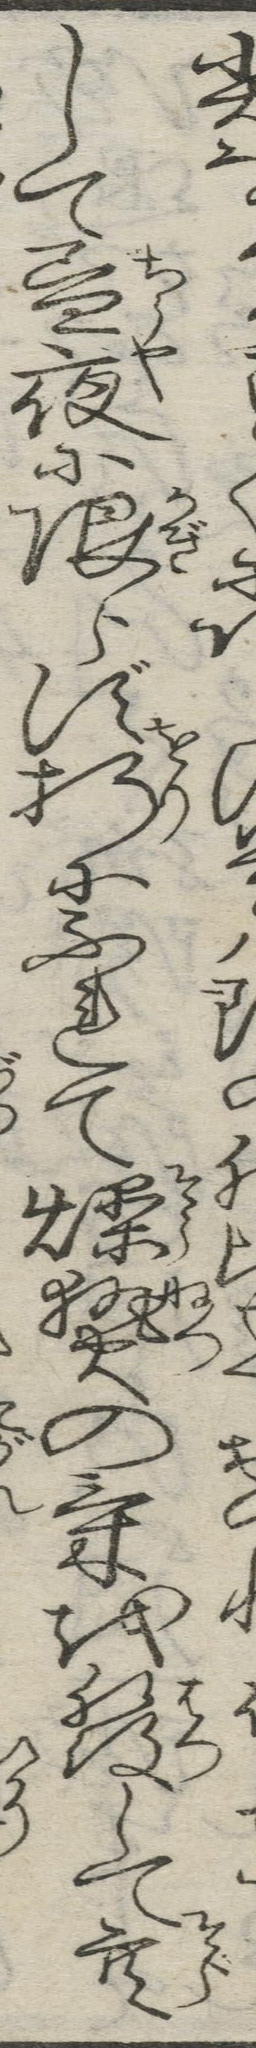して昼夜に限らず折にふれて燥熱の気を発して空
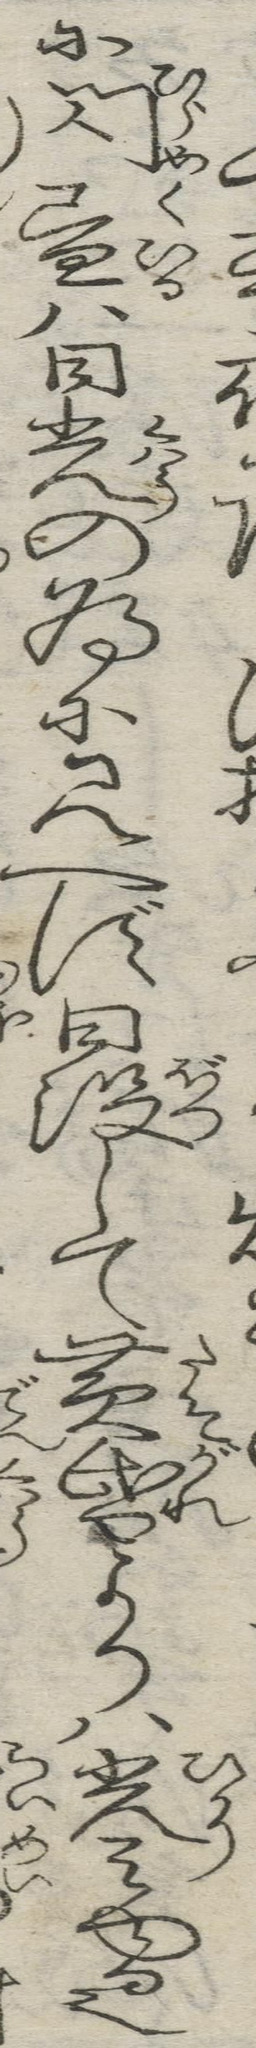に閃昼は日光の為にみへず日没して黄昏よりは光みゆる也
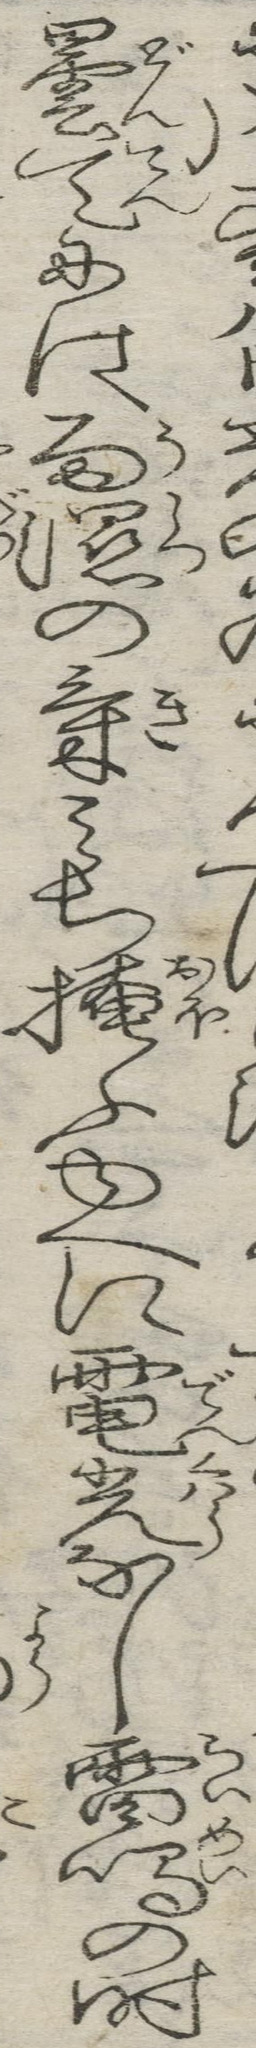曇天には雨湿の気みち掩ふゆへに電光なし雷鳴の時
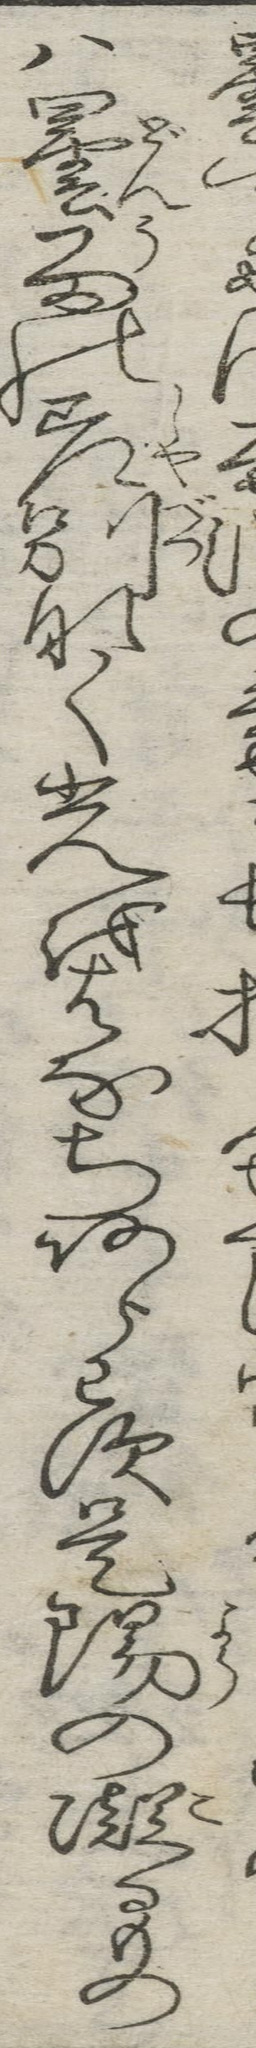は曇雨の差別なく光をはなちあらわす是陽の凝るもの
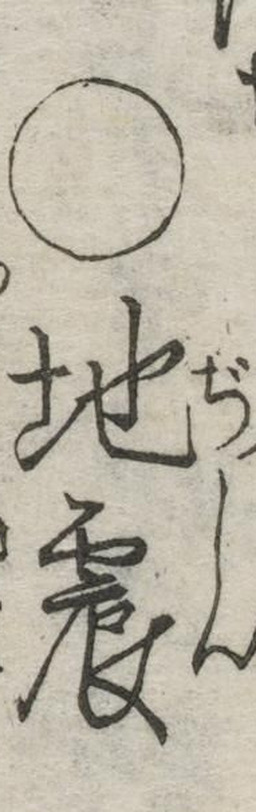○地震
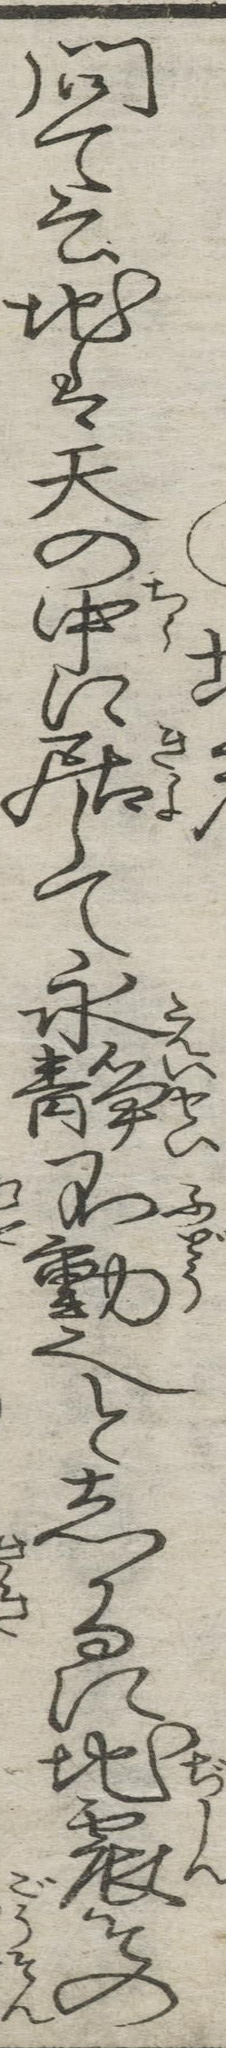問て云地は天の中に居して永静不動也としるに地震その
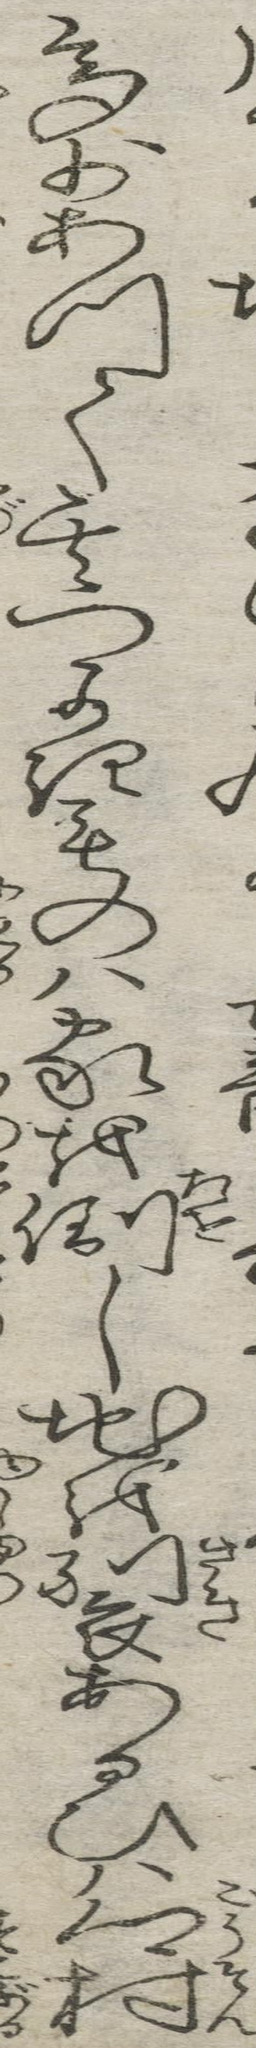多少あつて其つよきものは家を倒し地を裂あるひは郷村
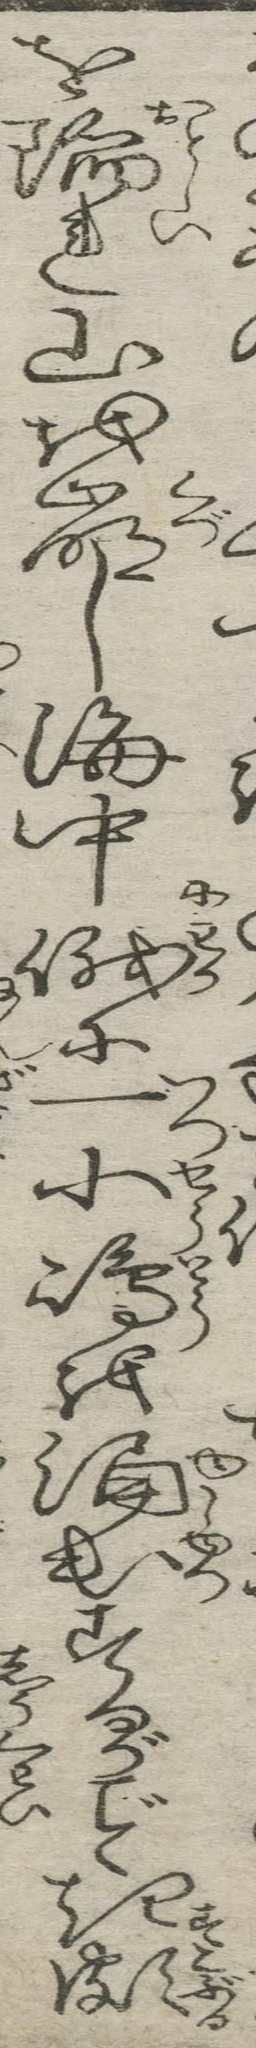を陥れ山を崩し海中俄に一小嶋を涌出するがごとき頗
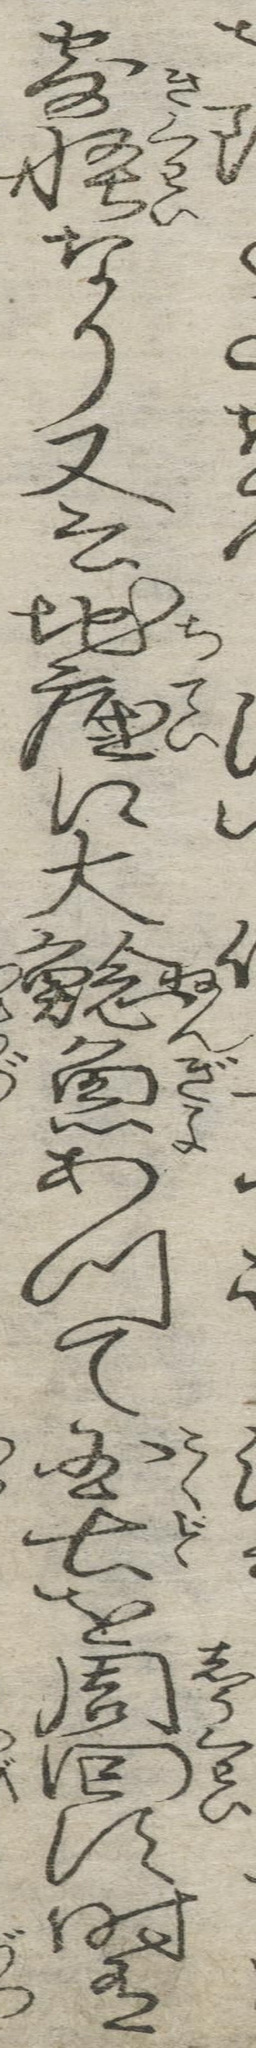奇怪なりまた云地底に大鯰魚あつて国土を周回す時有
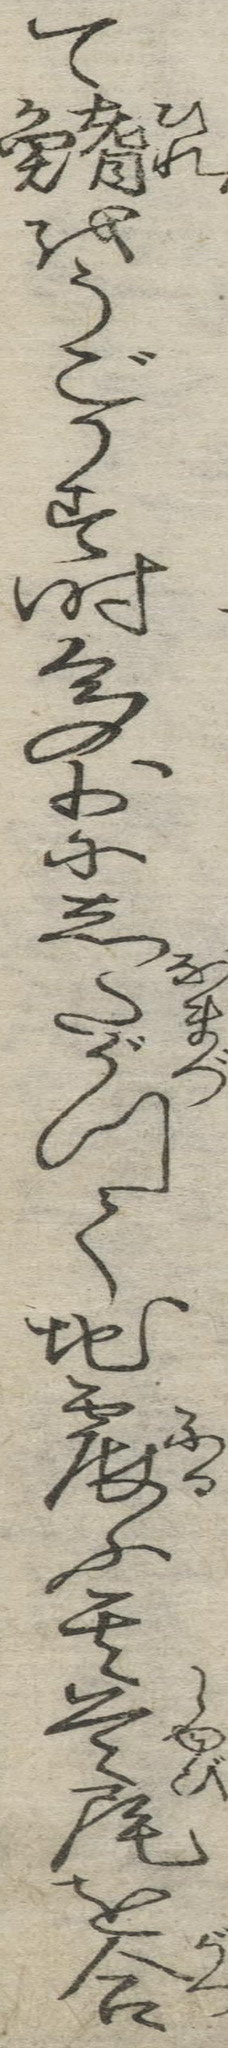て鰭を動かす時多少にしたがつて地震ふ其首尾を合

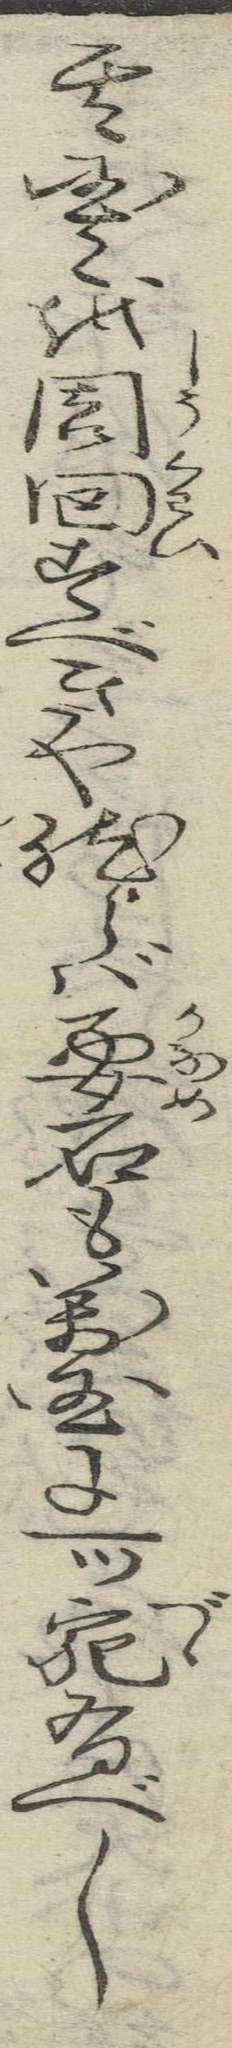其国を周回すべきや然らば要石もみ国に一ッ宛有べし
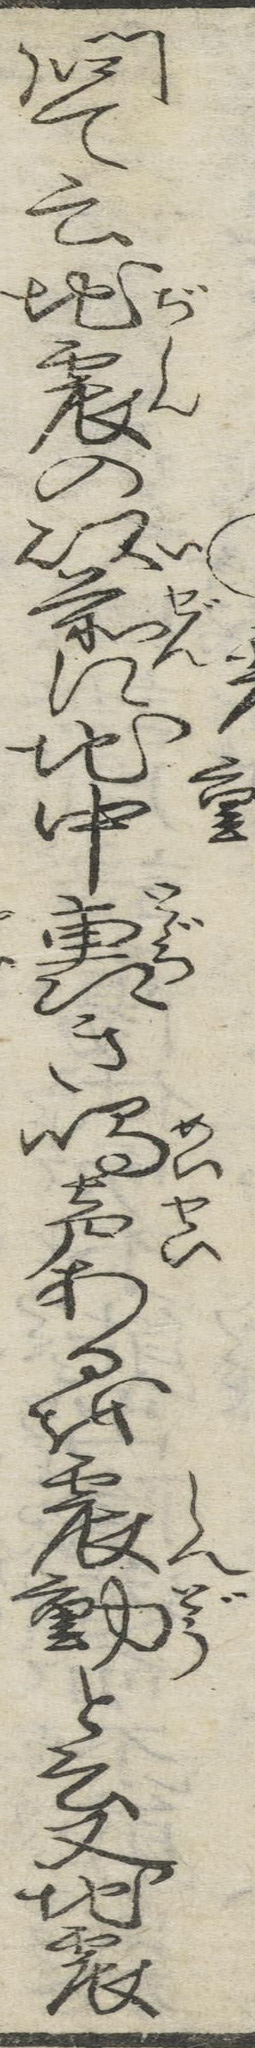問て云地震の以前に地中軣き鳴声あるを震動と云又地震
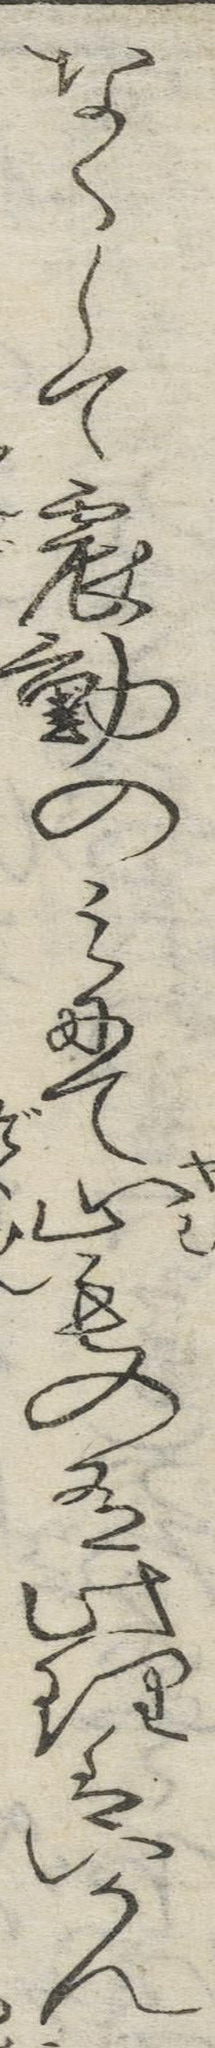なくして震動のみにて止もの有此理はいかん
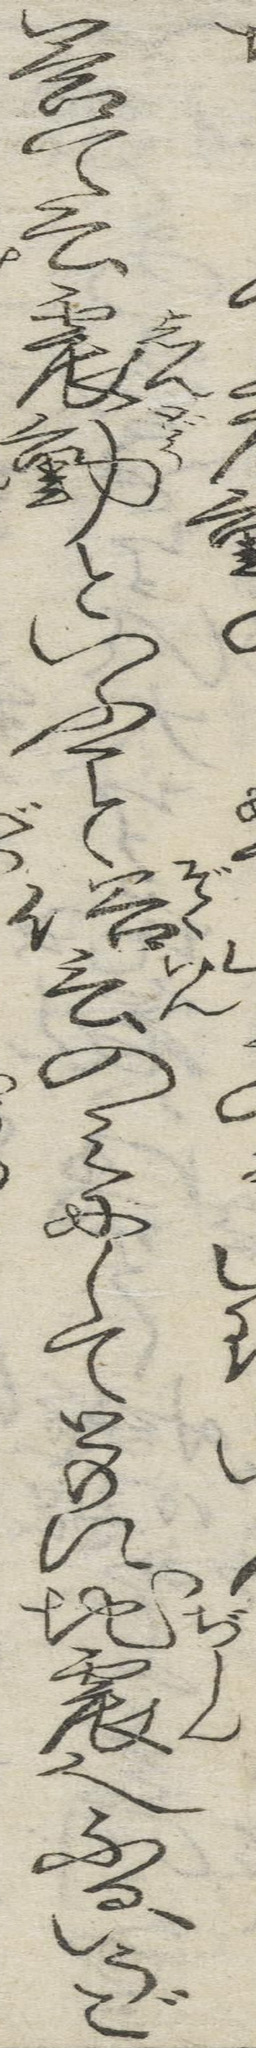答て云震動といふこと俗言のみにしてともに地震也ふるいうご
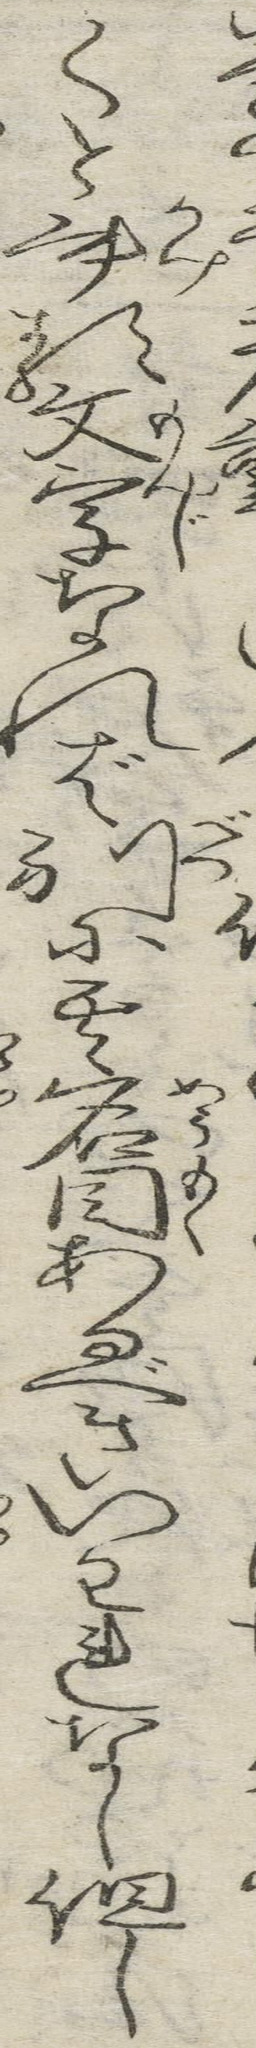くと書る文字なれば別に其名目あるべきいわれなし但し
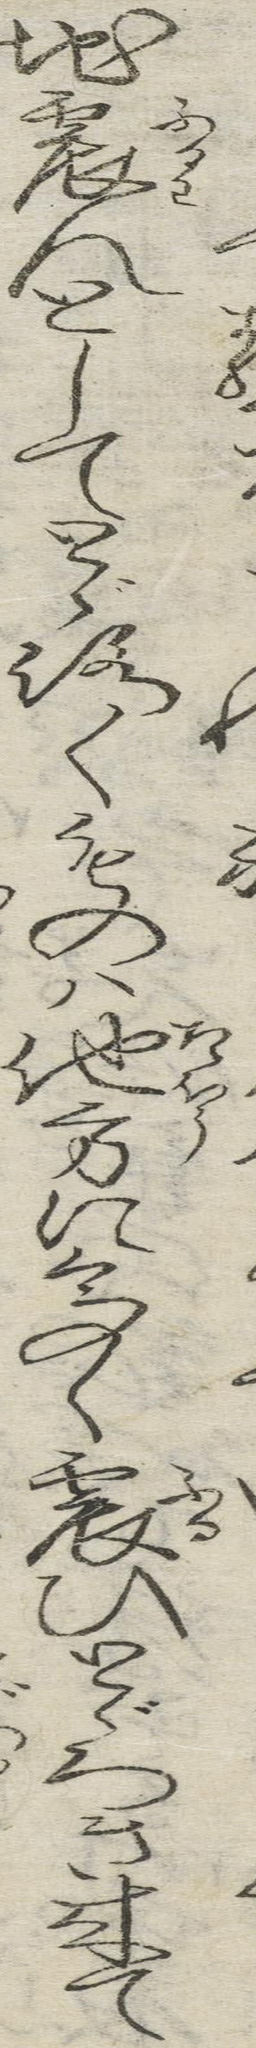地震んとしてとヾろくものは他方に多く震ひとヾろき来て
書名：訓蒙天地辨　地
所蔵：東京大学地震研究所図書室 Earthquake Research Institute Library, The University of Tokyo, JAPAN
